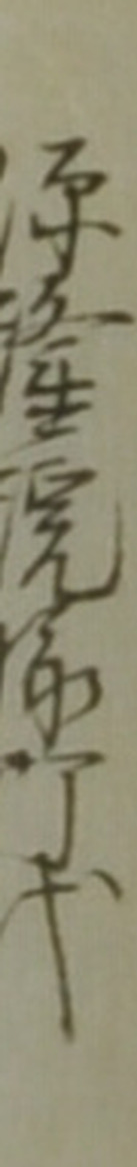源隆院様御代
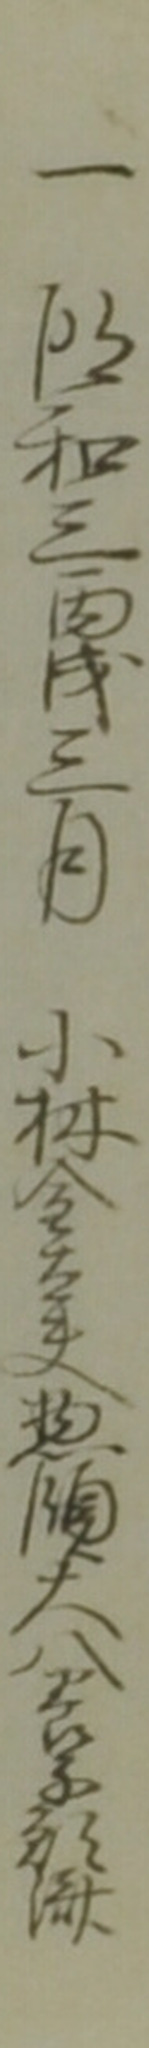一明和三丙戌三月小林金太夫惣領大八養子願済

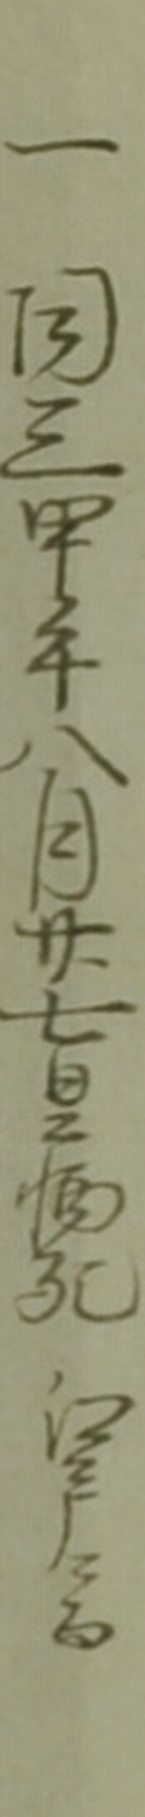一同三甲午八月廿七日病死江戸ニ而
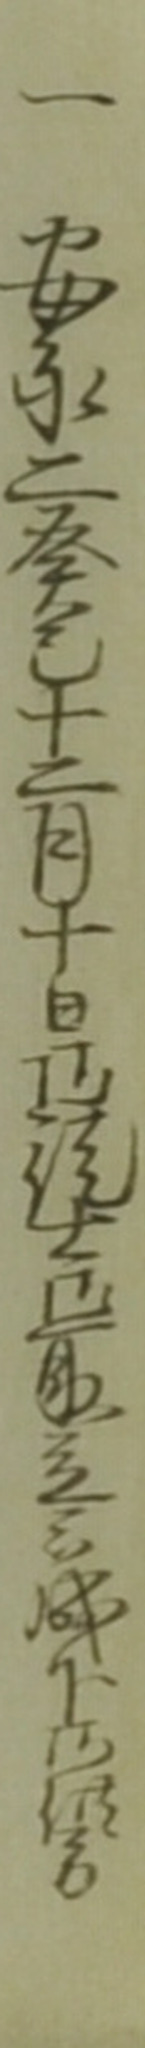一安永二癸巳十二月十日御徒士御取立被成下御供方
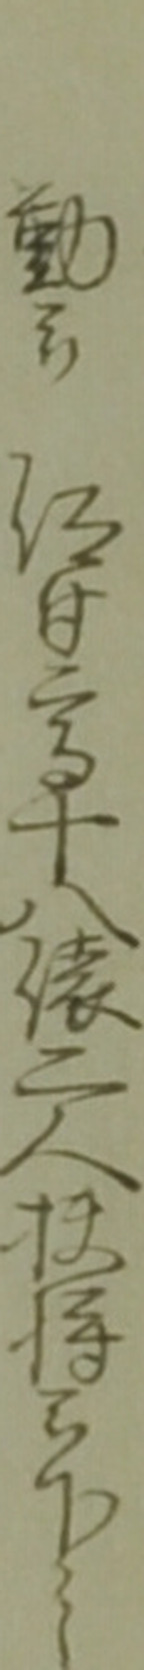勤被仰付高十八俵二人扶持被下之
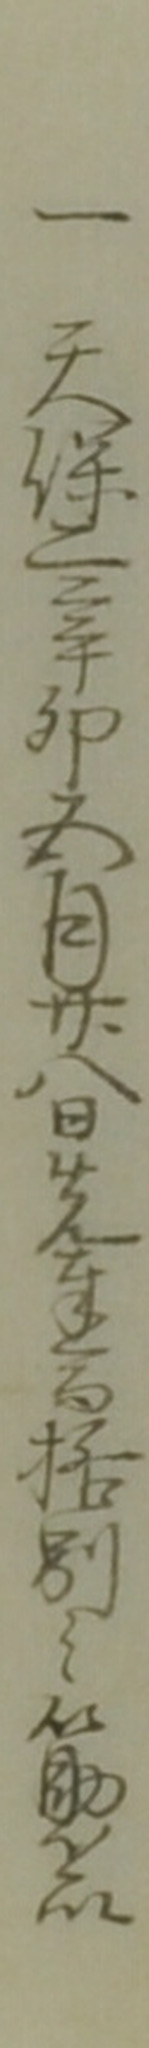一天保二辛卯五月廿八日先達而格別之筋を以
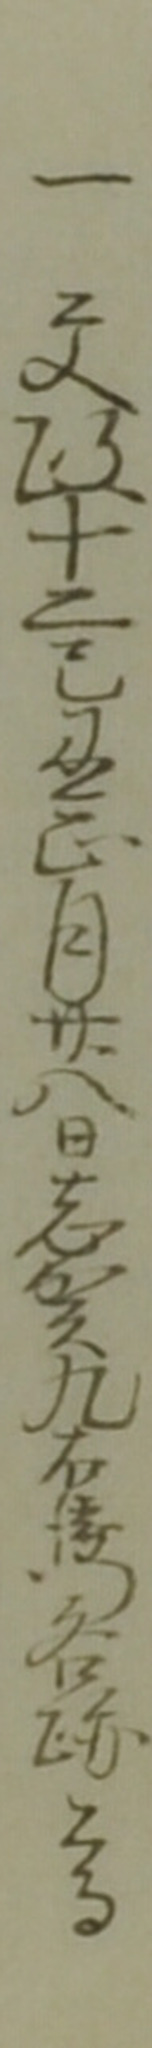一文政十二己丑正月廿八日志賀九右衛門名跡高
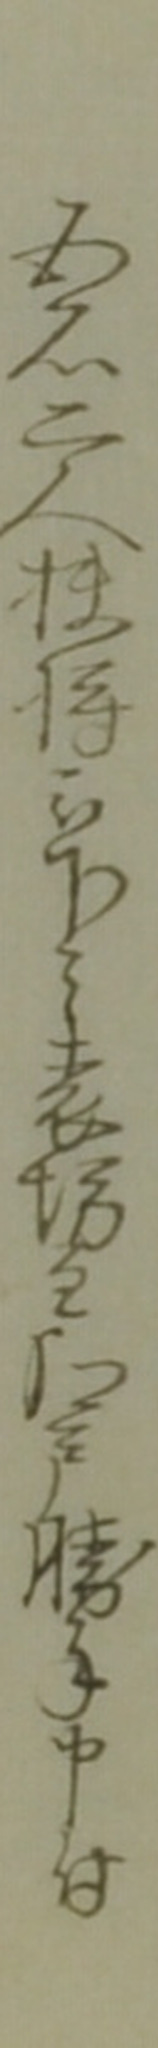五石二人扶持被下之表坊主江戸勝手申付
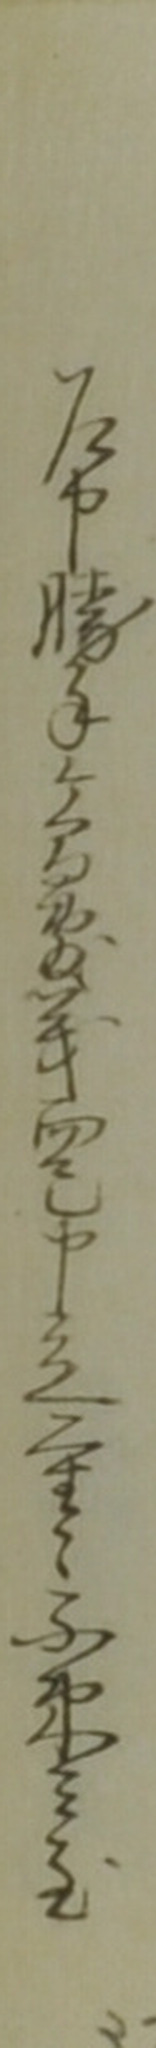召申勝手ヶ間敷義而己申立重々不束之至
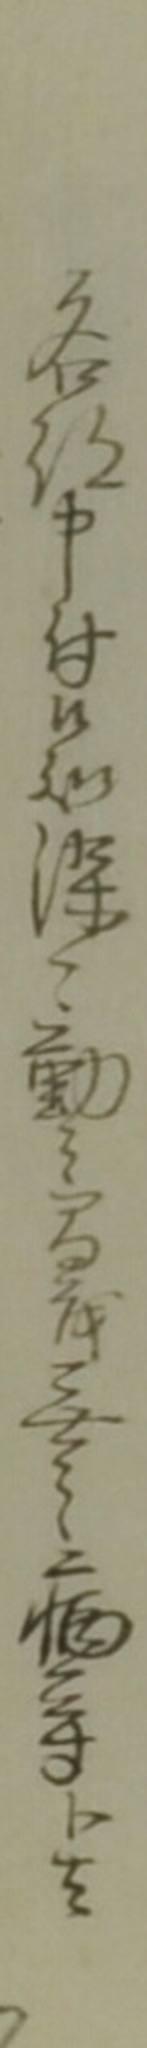名跡申付候処染々勤之間茂無之病気トは
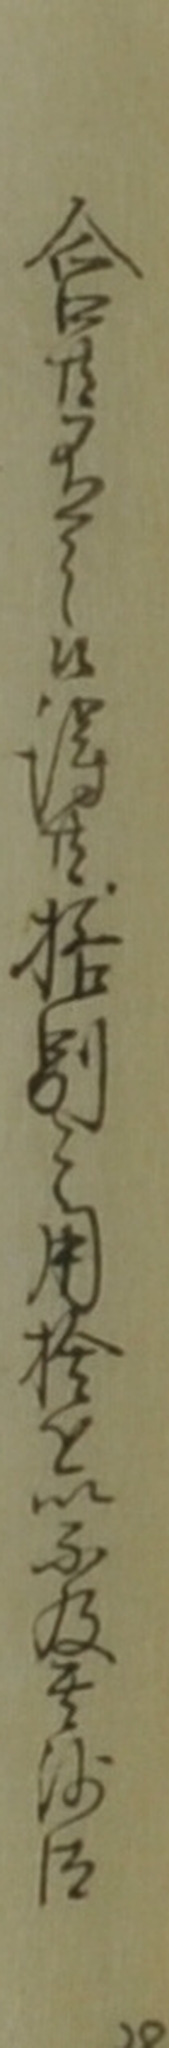含共有之候得共格別之用捨を以不及其沙汰
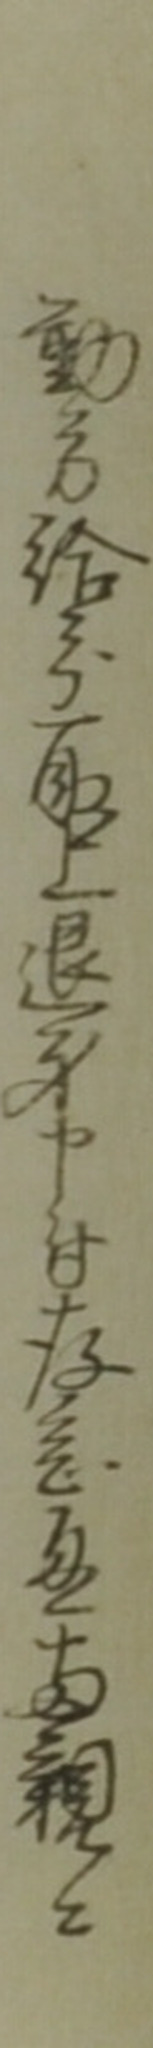勤方給分取上退身申付存念通両親ニ
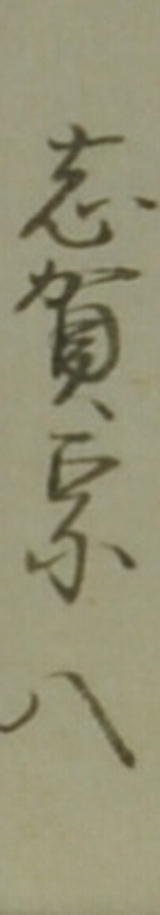志賀宗八

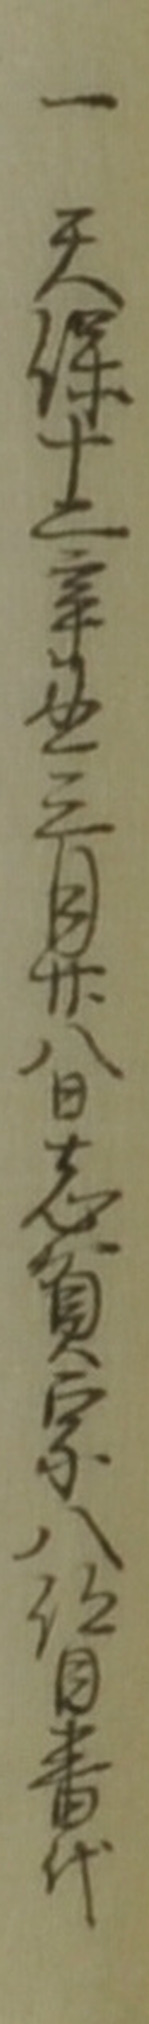一天保十二辛丑三月廿八日志賀宗八跡目番代
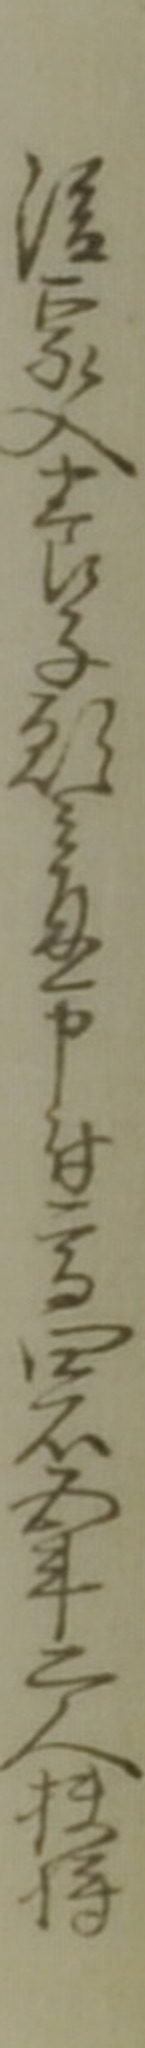後家入養子願之通申付高四石五斗二人扶持
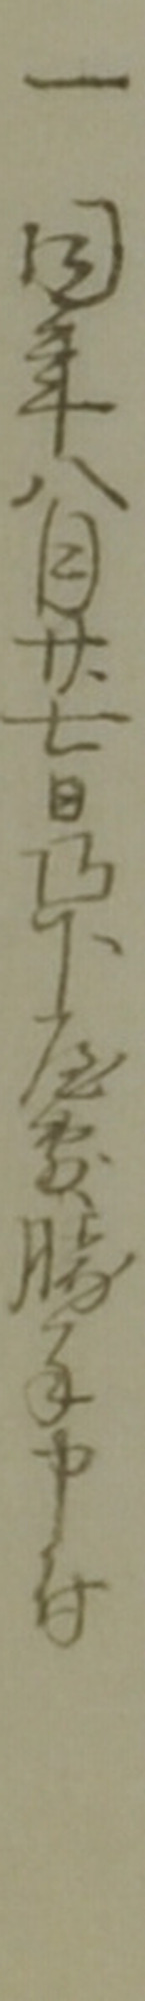一同年八月廿七日御下屋敷勝手申付
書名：無足諸士勤仕録（九）
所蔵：伊那市立高遠町図書館・合同会社AMANE
